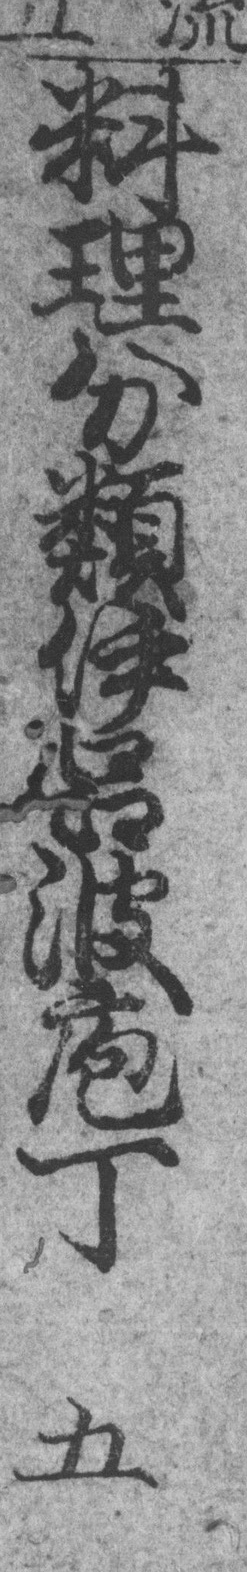料理分類伊呂波庖丁五

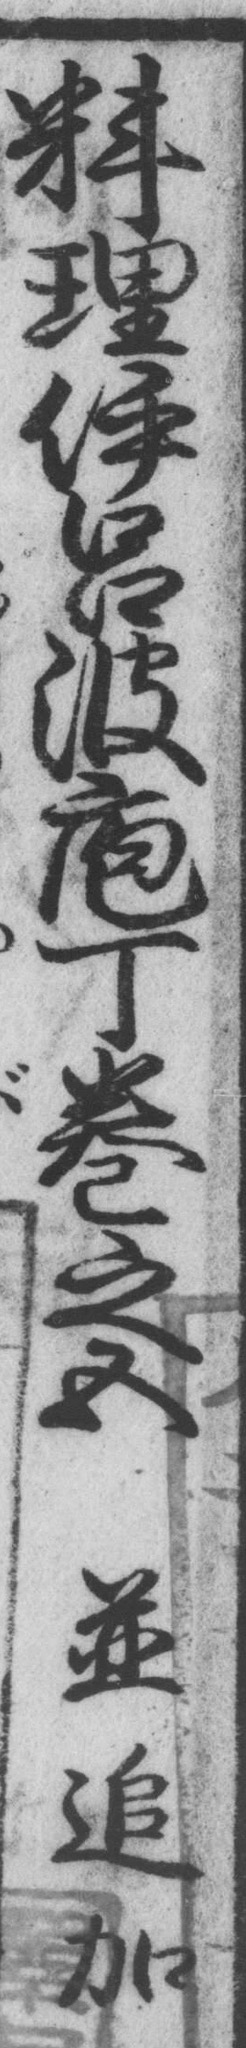料理伊呂波庖丁巻之五並追加
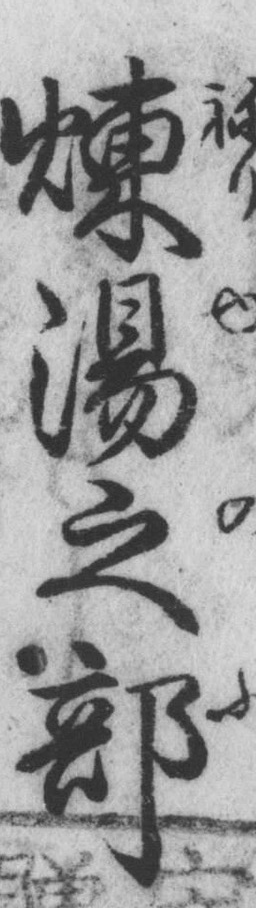練湯之部
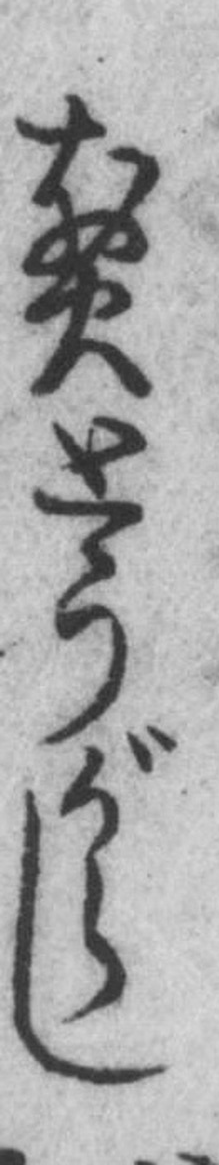沙湯煮とうがらし
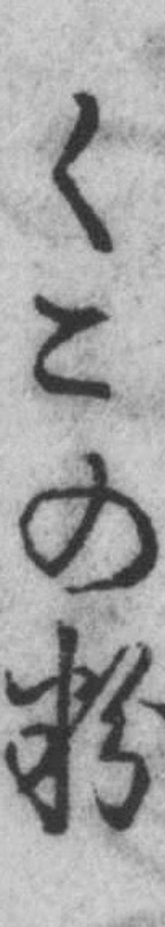くこの粉

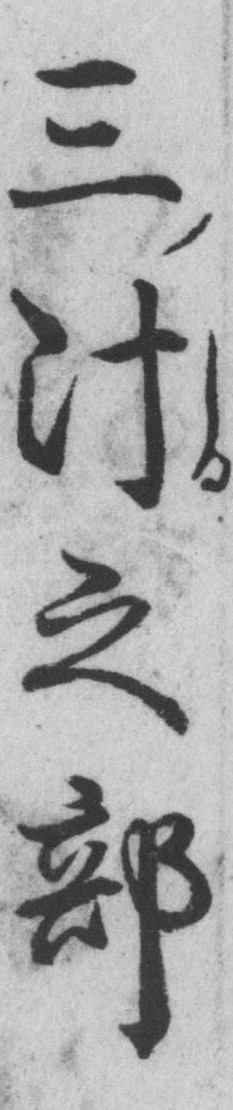三汁之部
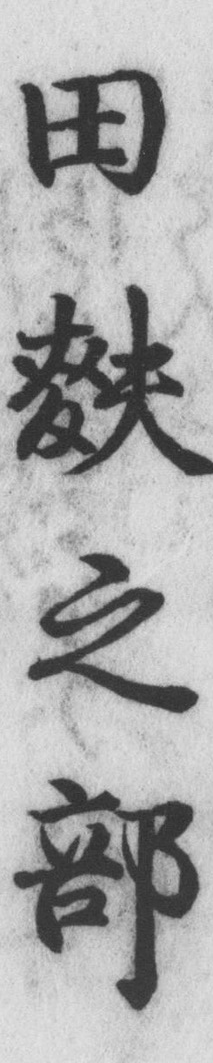田麩之部

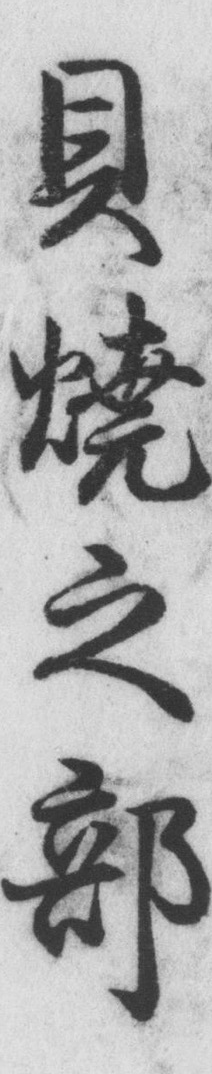貝焼之部

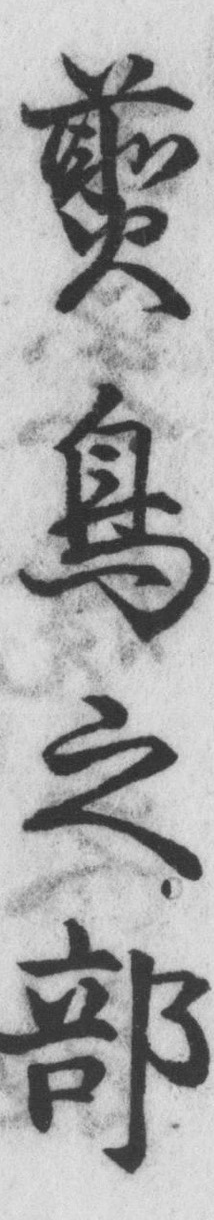煎鳥之部

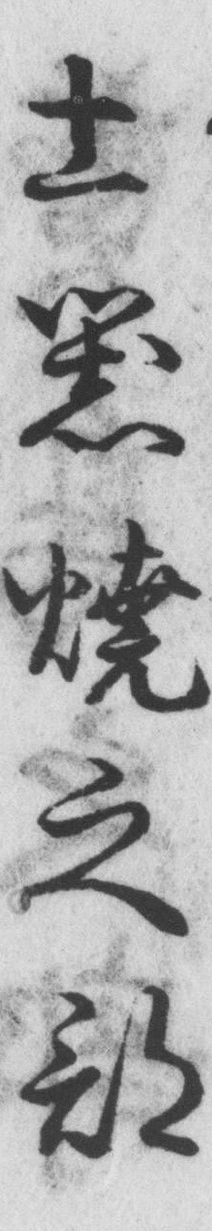土器焼之部
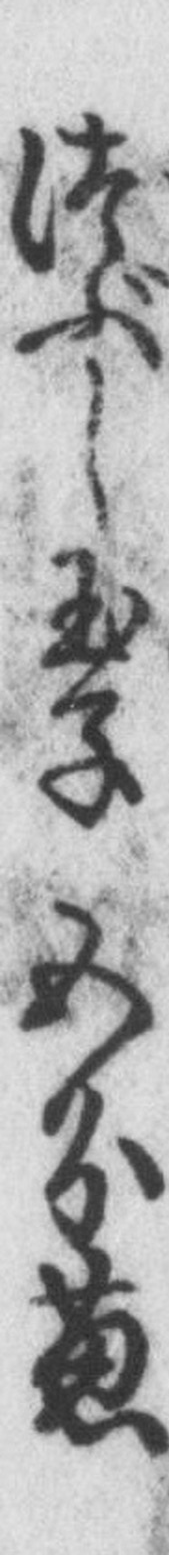徒ぶし玉子五分葱酒煮

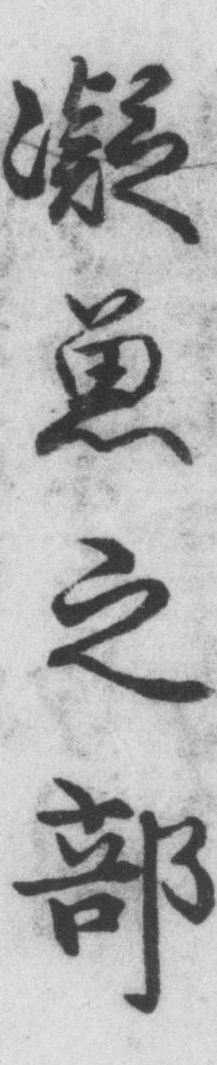凝魚之部
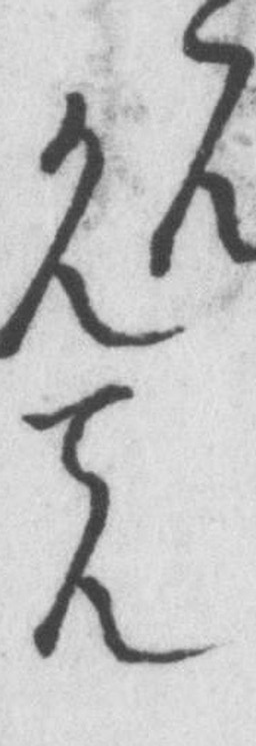かんてん
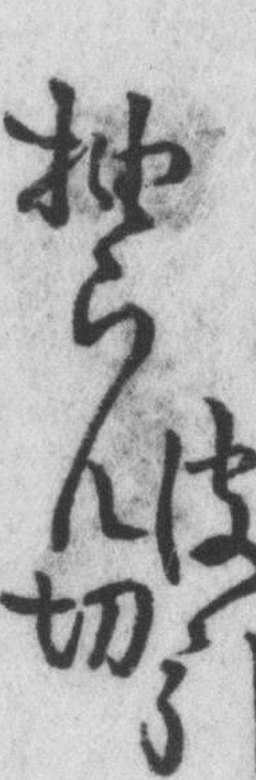柚らん切

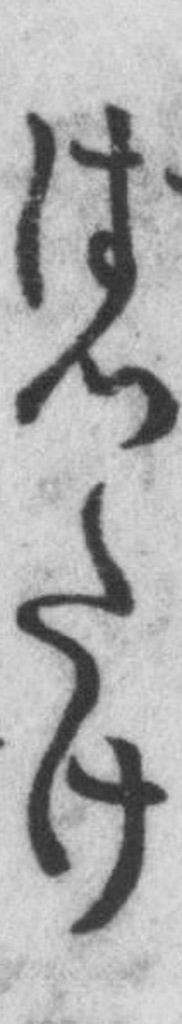はつたけ
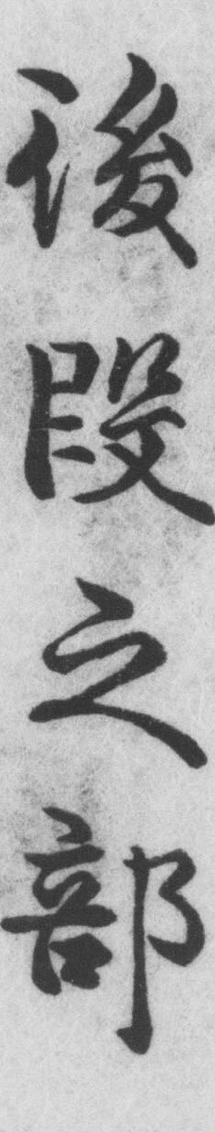後段之部
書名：料理伊呂波庖丁
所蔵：大阪府立大学学術情報センター 国文学研究資料館
